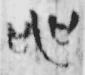申
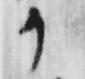人
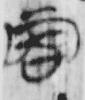丙
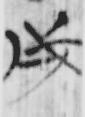戌
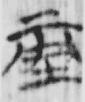坪（平）
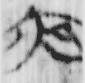○（夜）
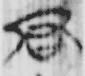君
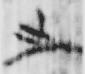之
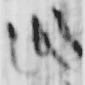州
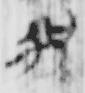加
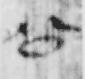公
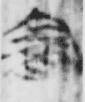酓
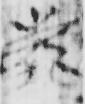鹿
